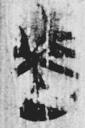耆
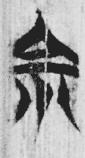宗
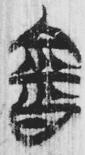○（密）
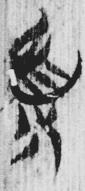须
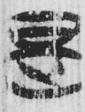是（氏）
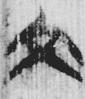文
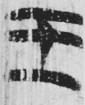王
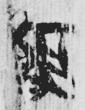○（聞）
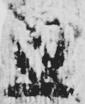之
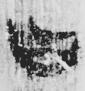曰
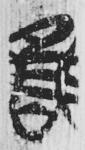唯（雖）
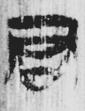君
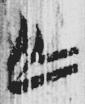亡（無）
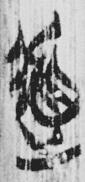道
